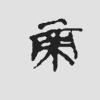帝
